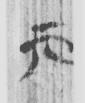亓
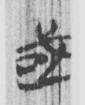或
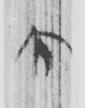大
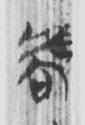唬
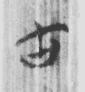古
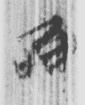唯
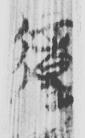{彳童}
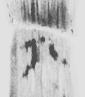亓
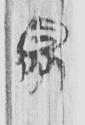眾
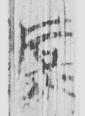庶
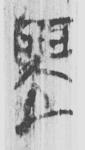{聑立}
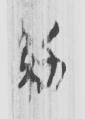糼
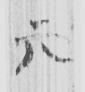亓
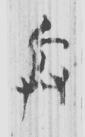兵
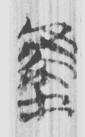{虍㚔}
